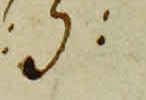3:
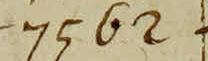7562
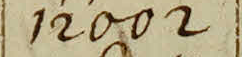12002
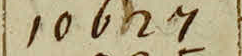10627
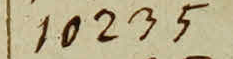10235
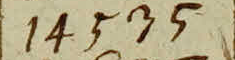14535
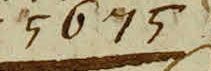5675
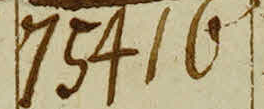75416
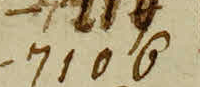7106
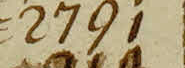2791
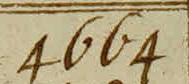4664
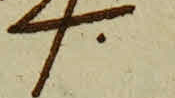4:
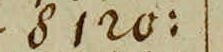8120:
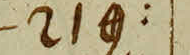219:
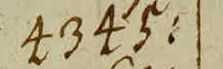4345:
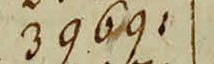3969:
